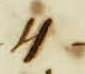4
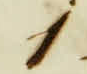1
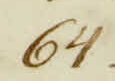64
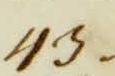43
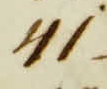41
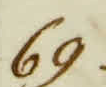69
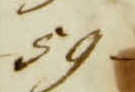59
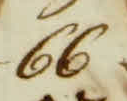66
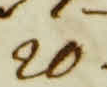20
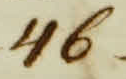46
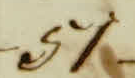51
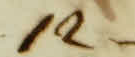12
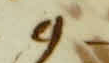9
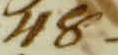48
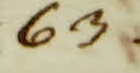63
